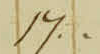17.
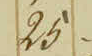25.
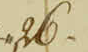26
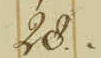28.
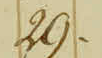29
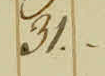31.
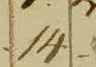14.
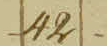42
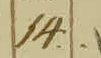14.
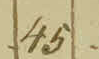45
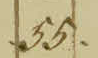55
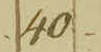40
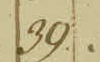39.
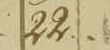22.
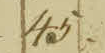45
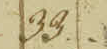33.
